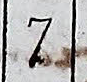7
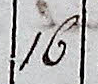16
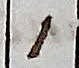1
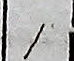1
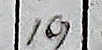19
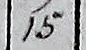15
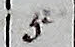5
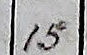15
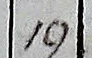19
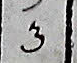3
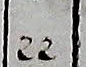22
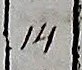14
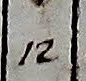12
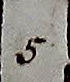5
